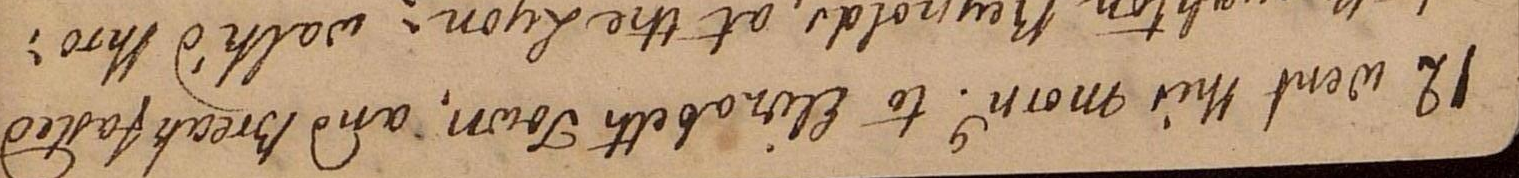12 went this Morn^g. to Elizabeth Town, and Breakfasted
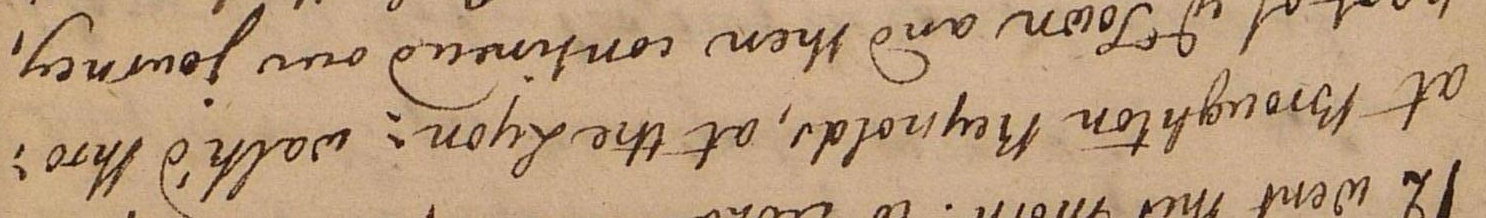at Broughton Reynolds, at the Lyon: walk'd thro:
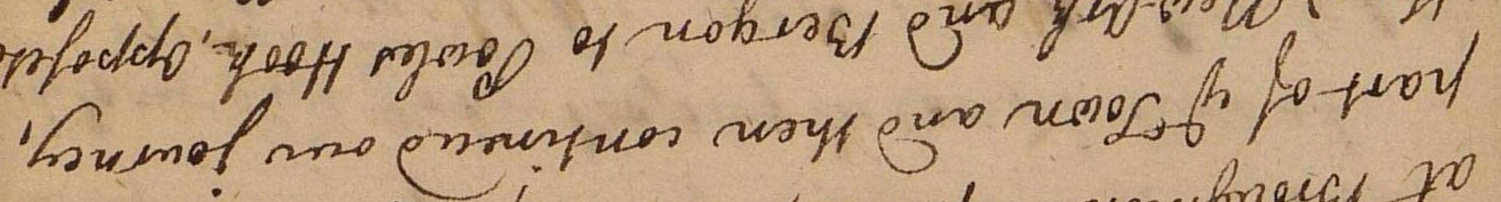part of y^e Town and then contineud our journey,
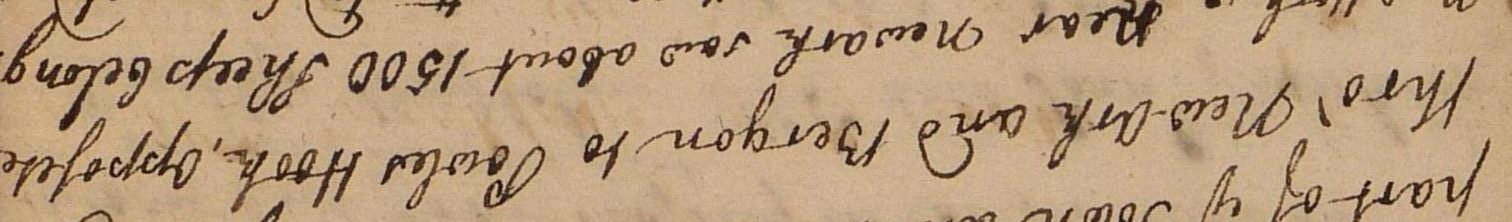thro' New-Ark and Bergon to Powles Hook, opposite
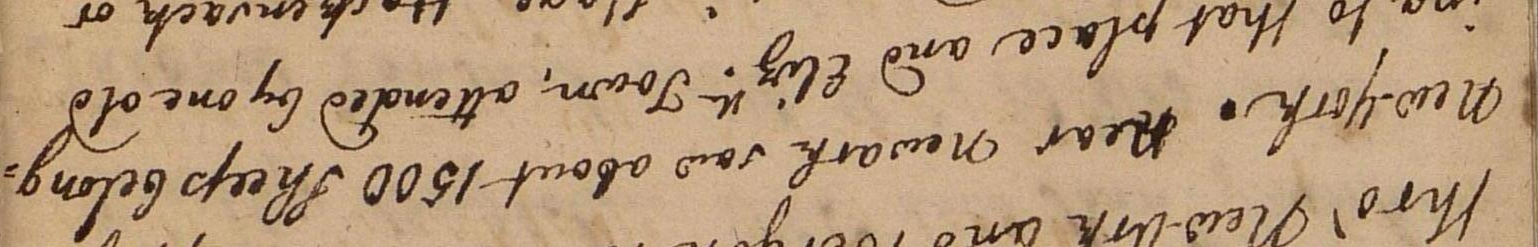New York. Near Newark saw about 1500 Sheep belong-
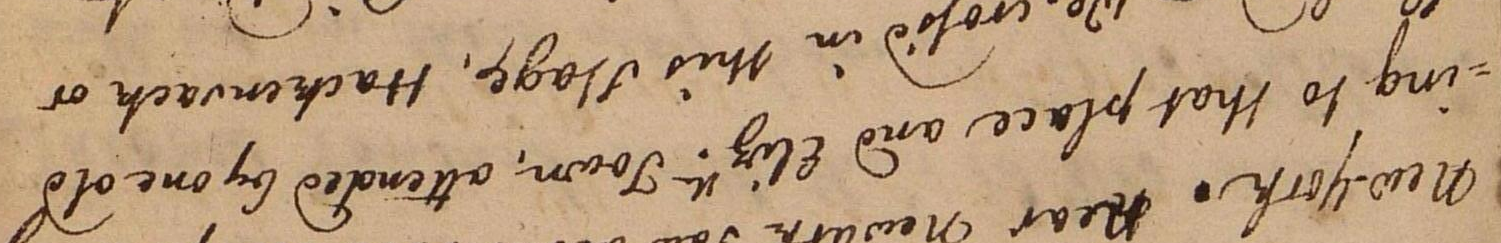-ing to that place and Eliz^th. Town, attended by one old
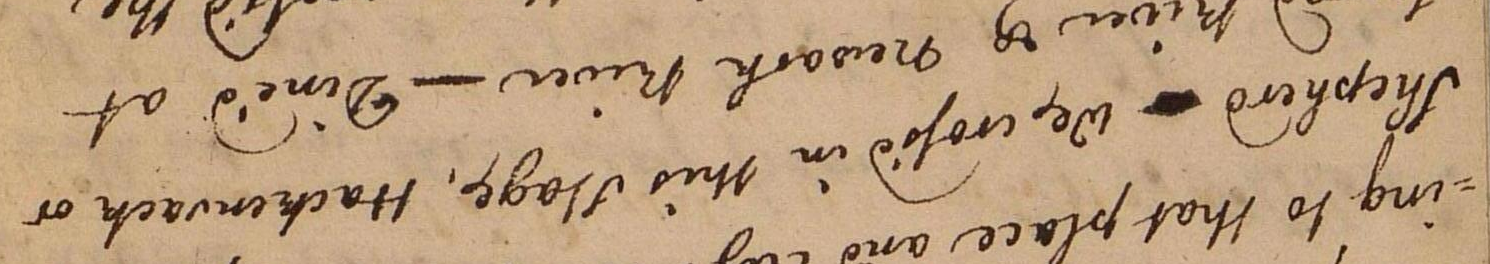Shepherd - We cross'd in this Stage, Hackensack or
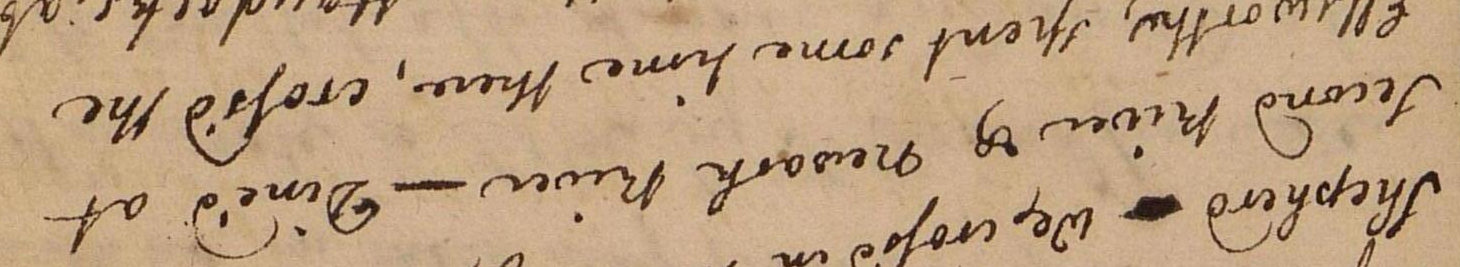Second River & Newark River - Dine'd at
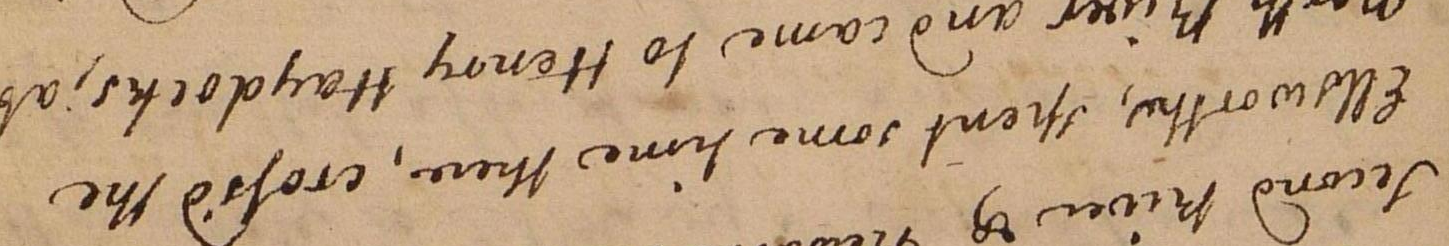Ellsworths, spent some time there, cross'd the
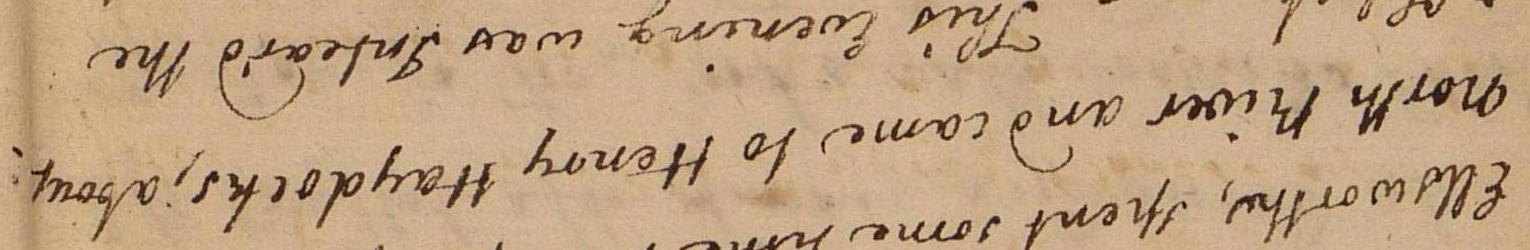North River and came to Henry Haydocks, about
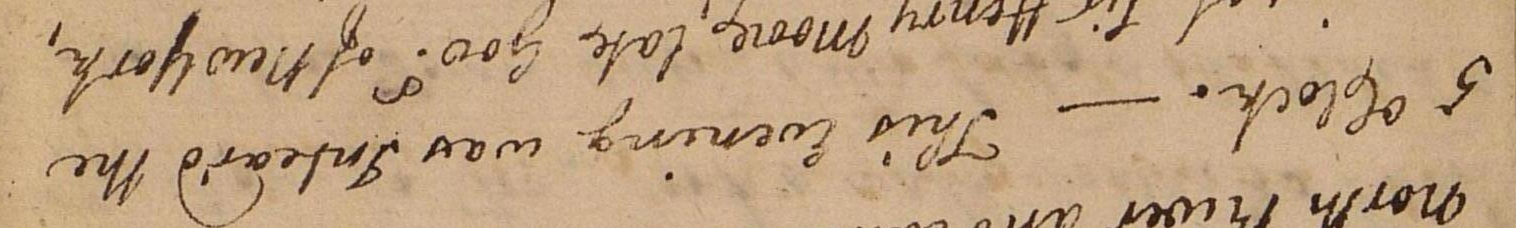5 ^o Clock. - This Evening was Intear'd the
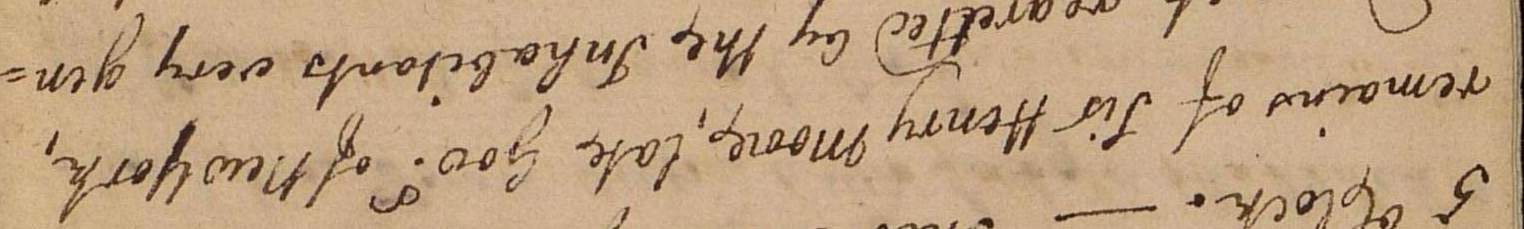remains of Sir Henry Moore, late Gov^r. of New York,
